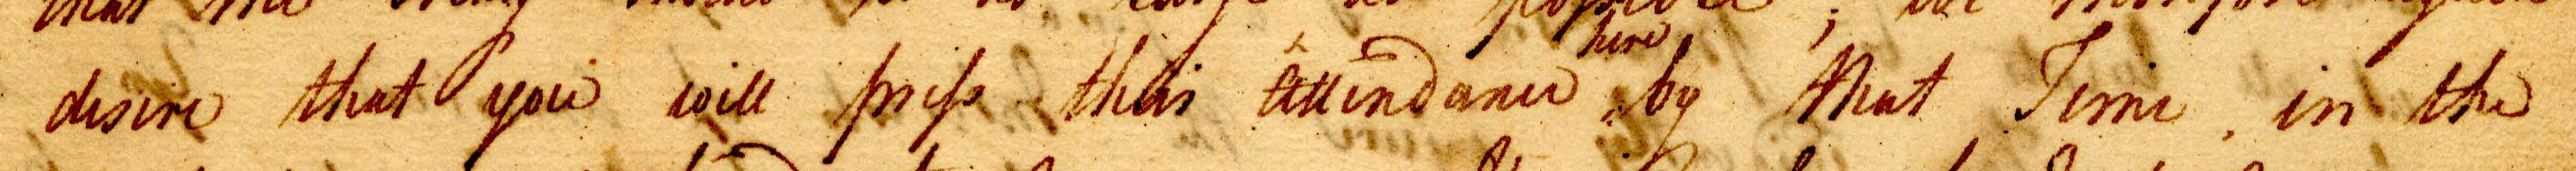desire that you will press this attendance ^ by that Time in the
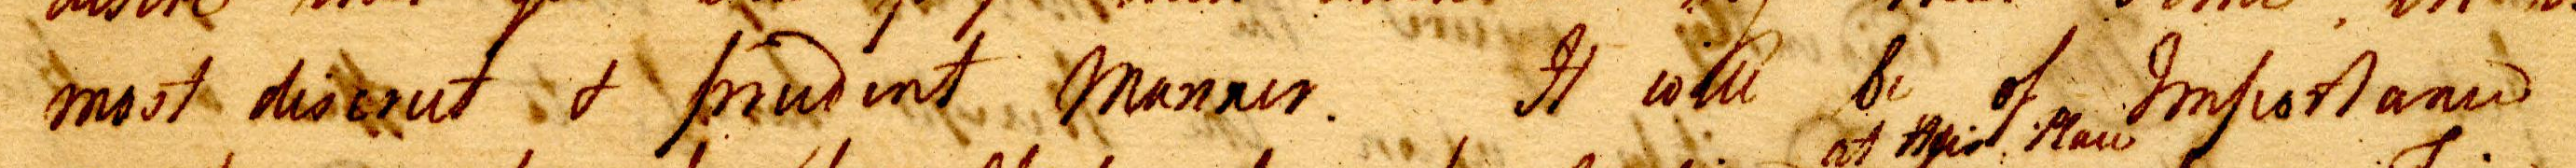most discreet & prudent manner. It will be of Importance
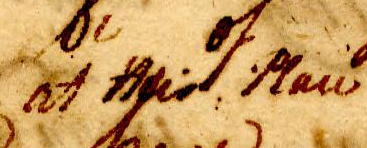at this Place
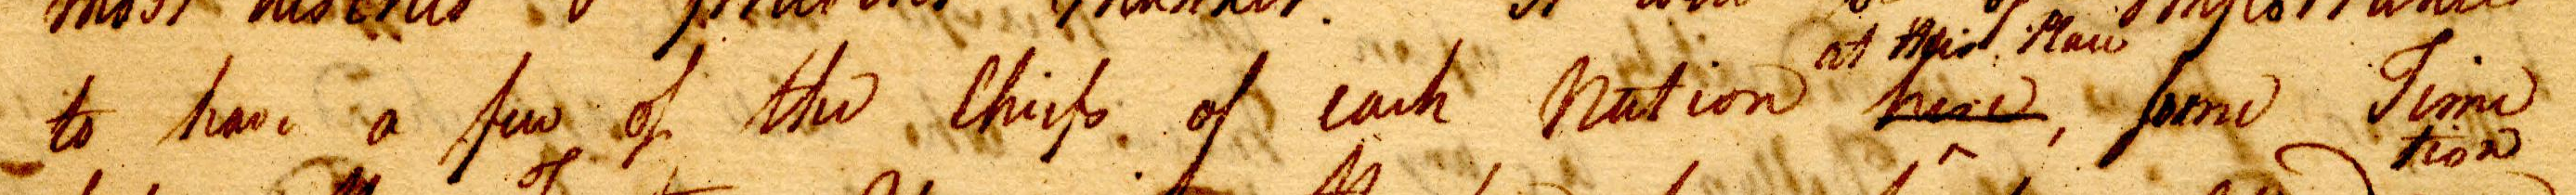to have a few of the Chiefs of each nation here^, some time
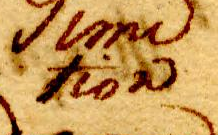tion
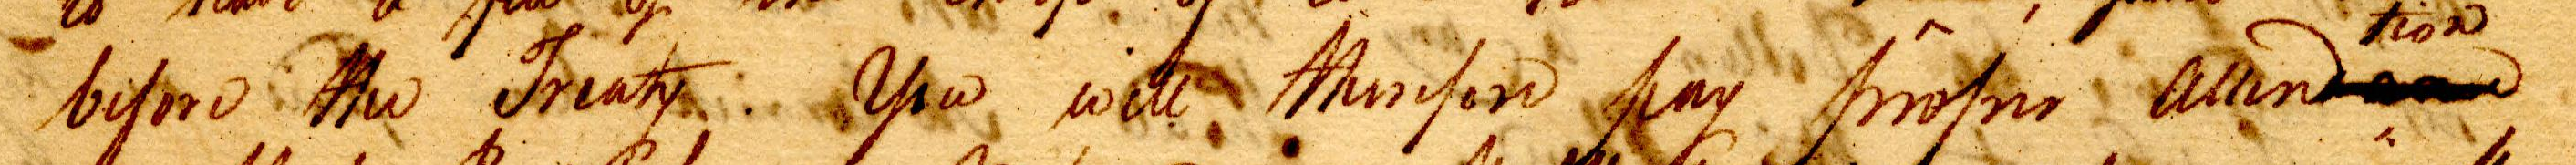before the Treaty. You will therefore pay proper attendance^
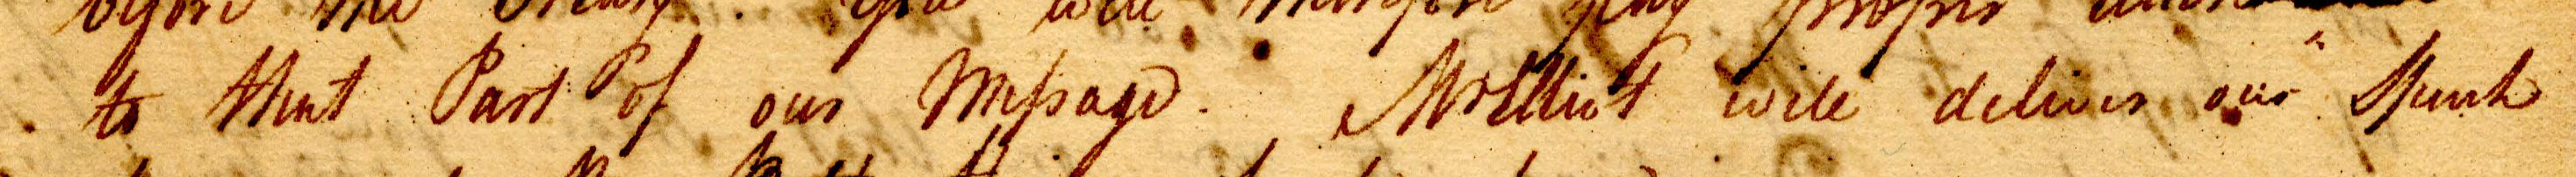to that Part of our Message. M^r Elliot will deliver our Speech
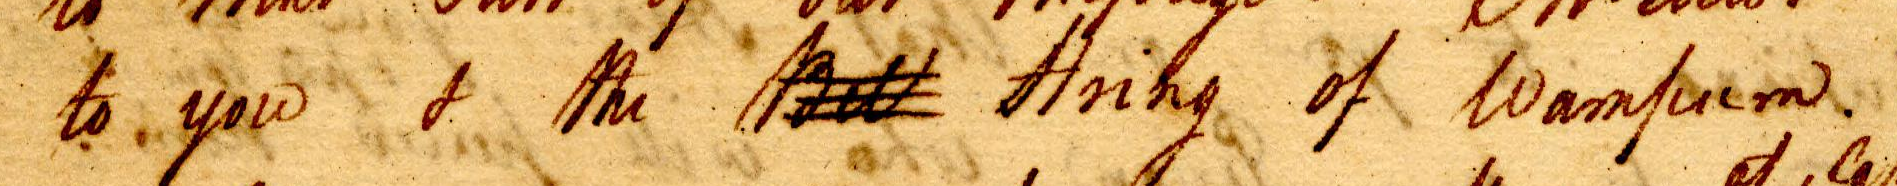to you & the Belt String of Wampum.
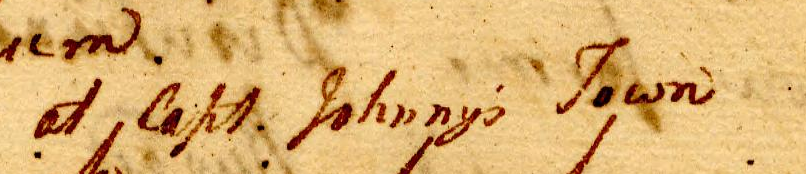at Capt. Johnny's Town
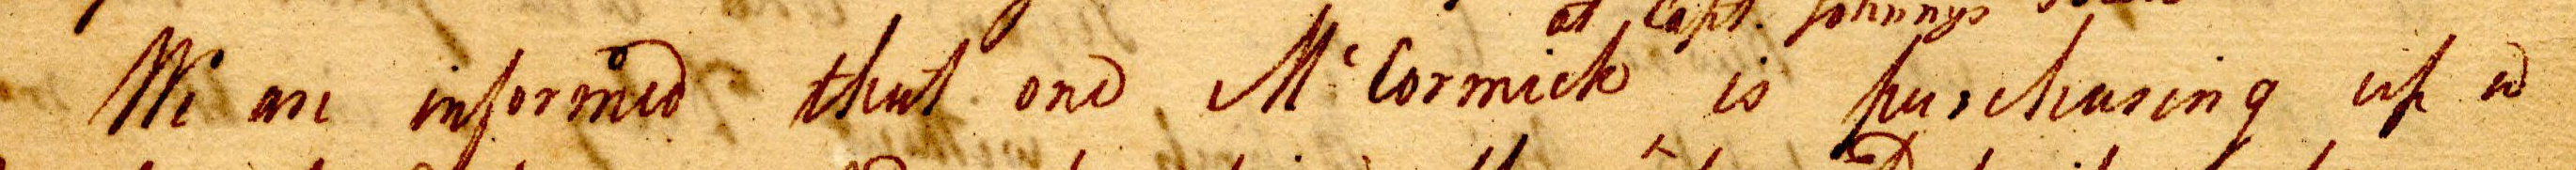We are informed that one M^cCormick ^ is purchasing up a
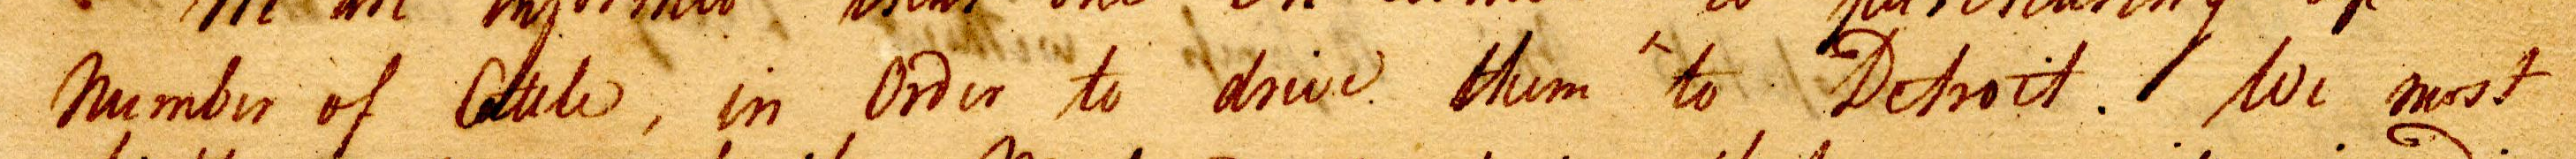number of cattle, in order to drive them to Detroit. We most
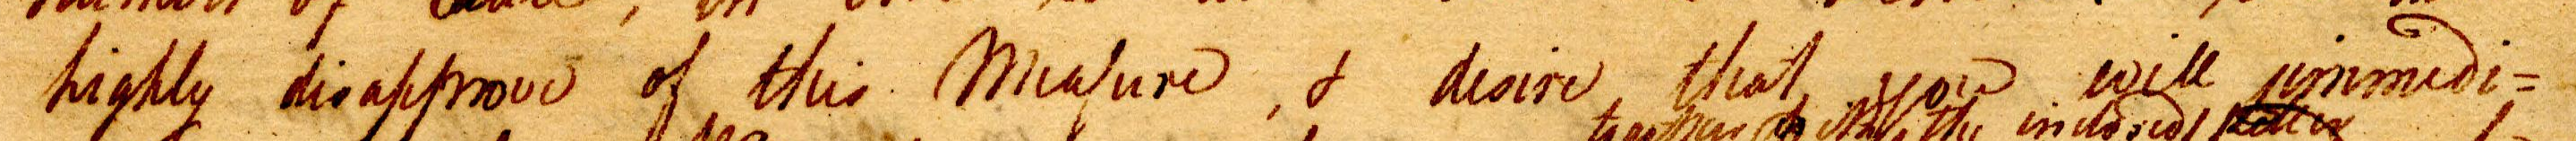highly disapprove of this Measure, & desire that you will immedi-
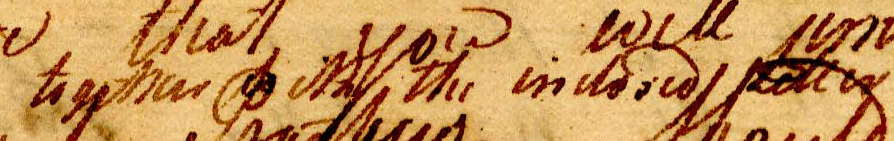together with the inclosed letter
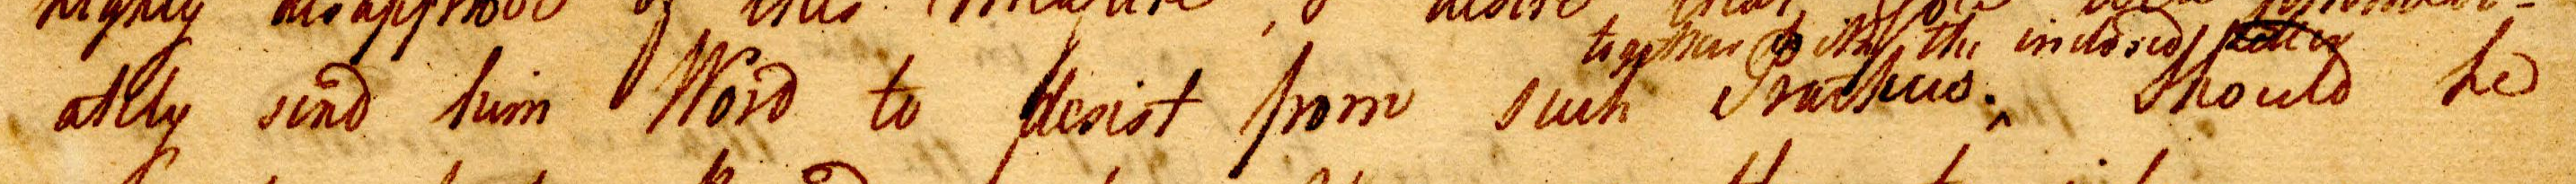ately send him Word to desist from such Practices.^ Should he
